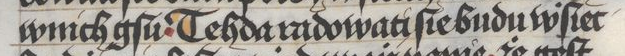wnich gſu.Tehda radowati ſie budu wẛiec¬
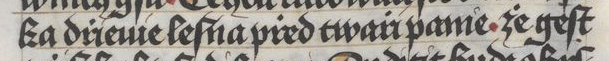ka dṙieuie leſna pṙed twaṙi panie.że geſt
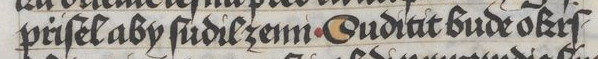pṙiſel aby ſudil zemi.Suditit bude okrſ¬
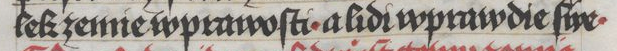lek zemie wprawoſti.a lidi wprawdie ſwe.
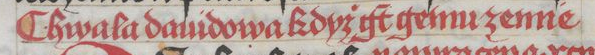Chwala dauidowa kdyż ḡt gemu zemie
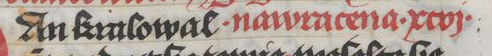An kralowal.nawracena.xcvj.
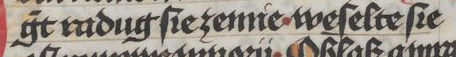ḡt radug ſie zemie.weſelte ſie
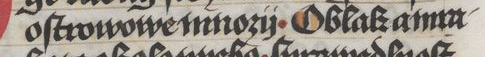oſtrowowe mnozij.Oblak a mra¬
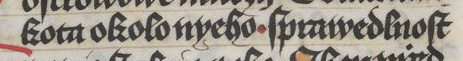kota okolo nyeho.ſprawedlnoſt
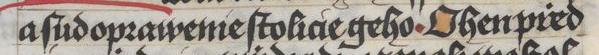a ſud oprawenie ſtolicie geho.Ohen pṙed
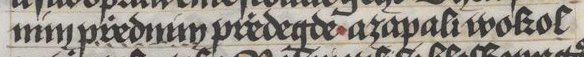ním pṙedním pṙedegde.a zapali wokol
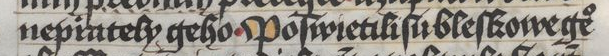nepṙately geho.Poſwietili ſu bleſkowe geo
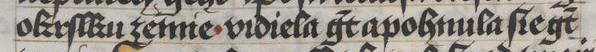okrſlku zemie.vidiela ḡt a pohnula ſie ḡt
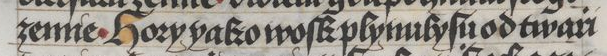zemie.Hory yako woſk plynulyſu od twaṙi
